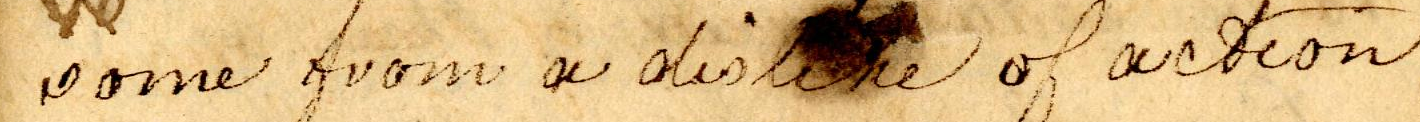some from a dislike of action
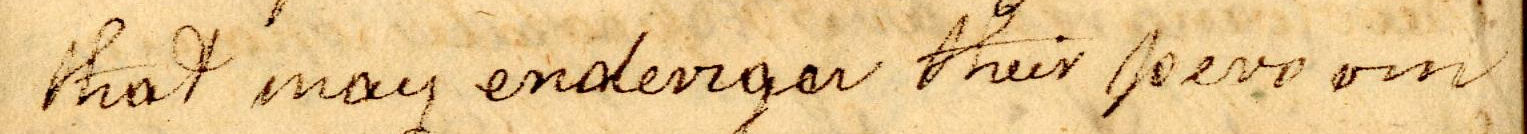that may enderger their person
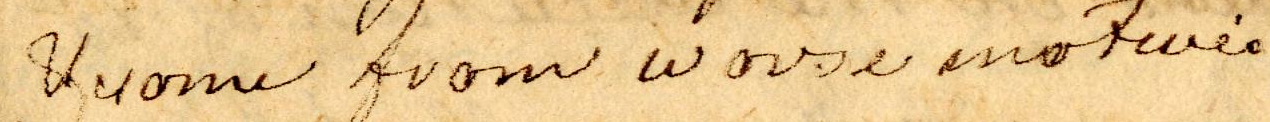& some from worse motives
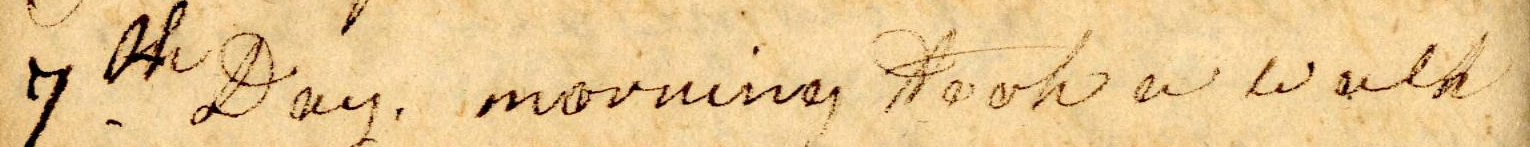7^th Day. morning took a walk
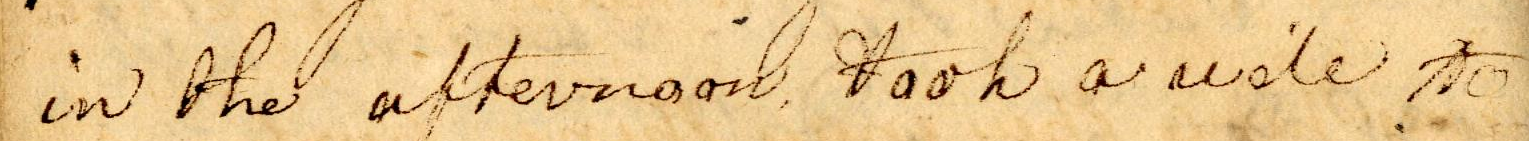in the afternoon, took a ride to
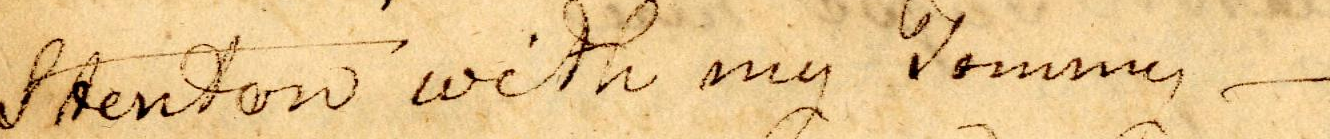Stenton with my Tommy-
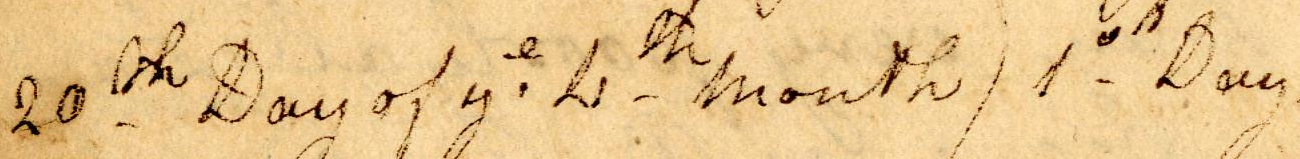20^th. Day of y^e 4^th. Month ) 1^st. Day.
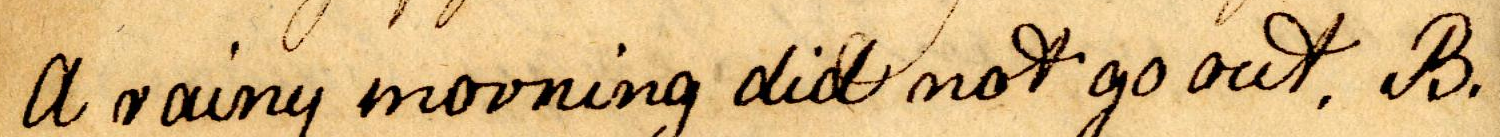A rainy morning did not go out, B.
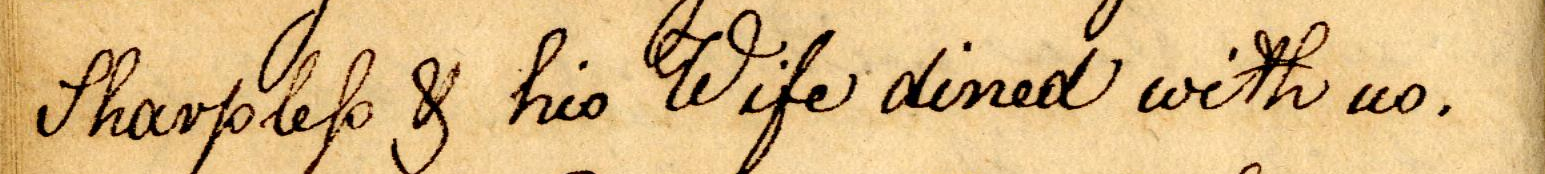Sharpless & his Wife dined with us.
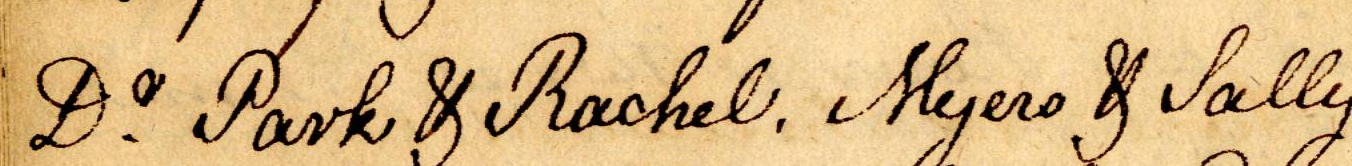D^r Park & Rachel, Myers & Sally
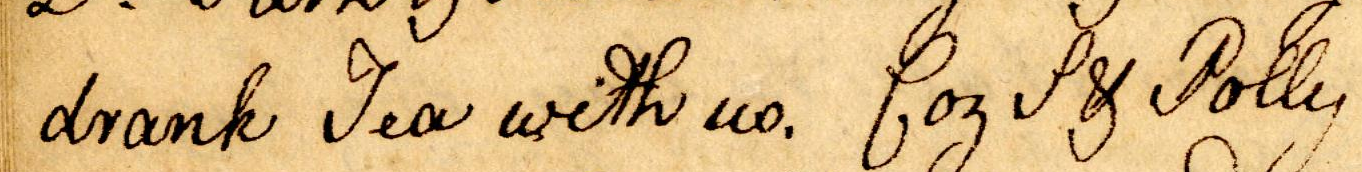drank Tea with us. Coz S & Polly
